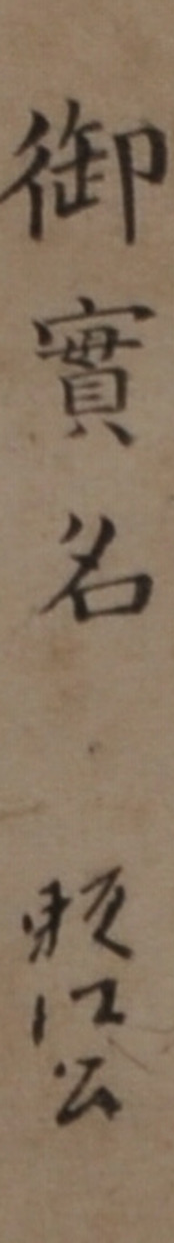御実名頼以公

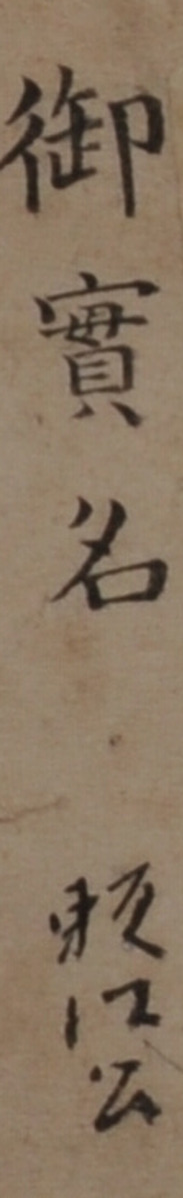御実名頼以公
